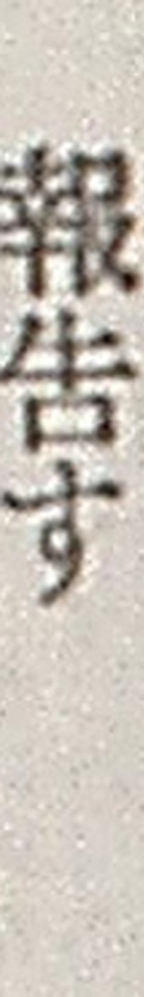報告す
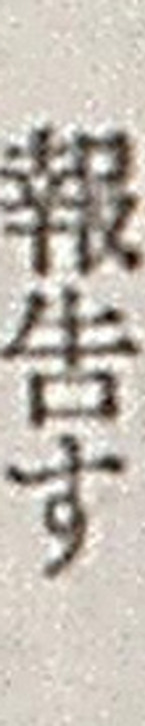報告す
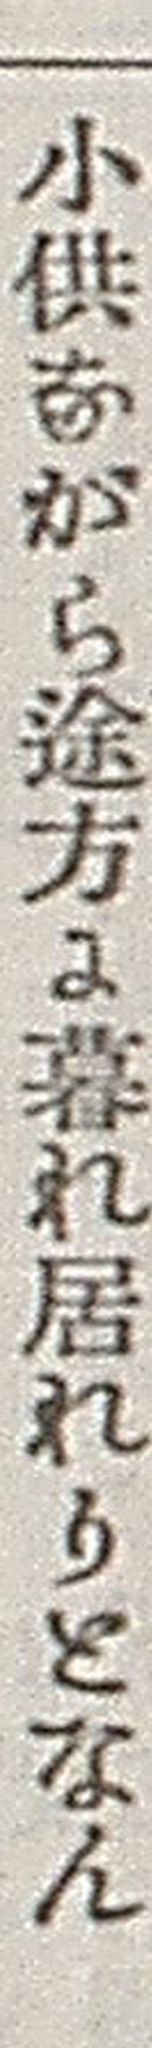小供ながら途方に暮れ居れりとなん
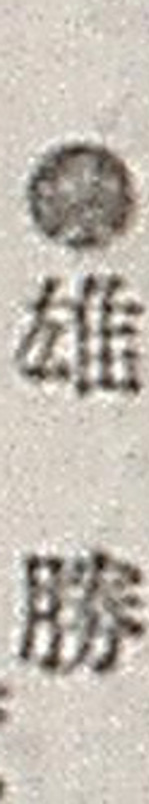●雄勝
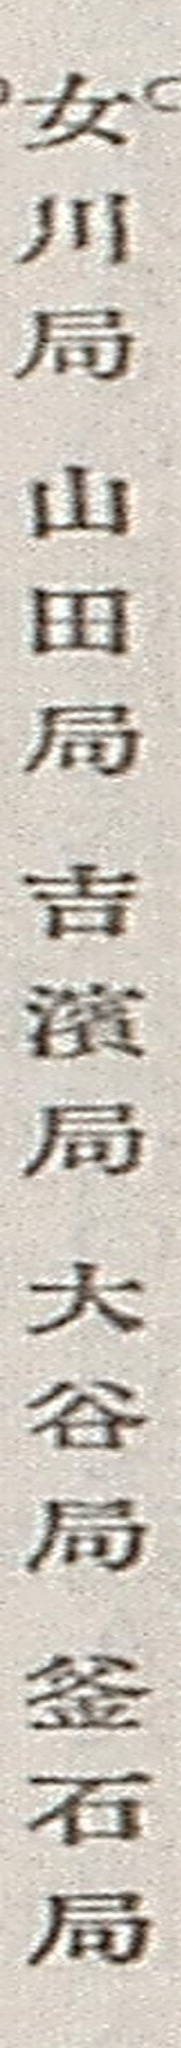女川局山田局吉浜局大谷局釜石局
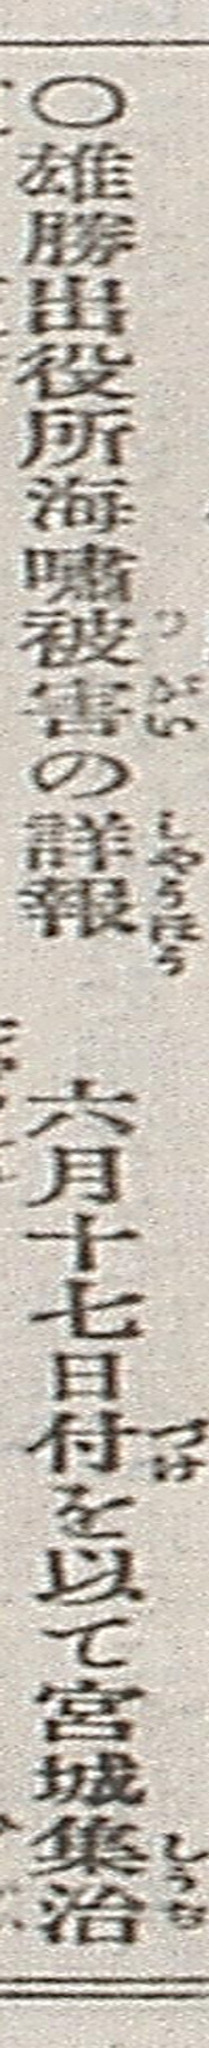○雄勝出役所海嘯被害の詳報六月十七日付を以て宮城集治
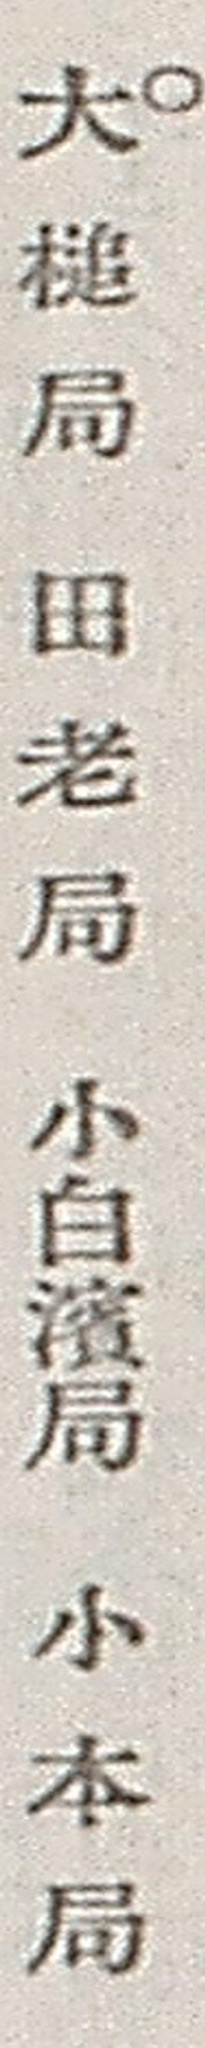大槌局田老局小白浜局小本局
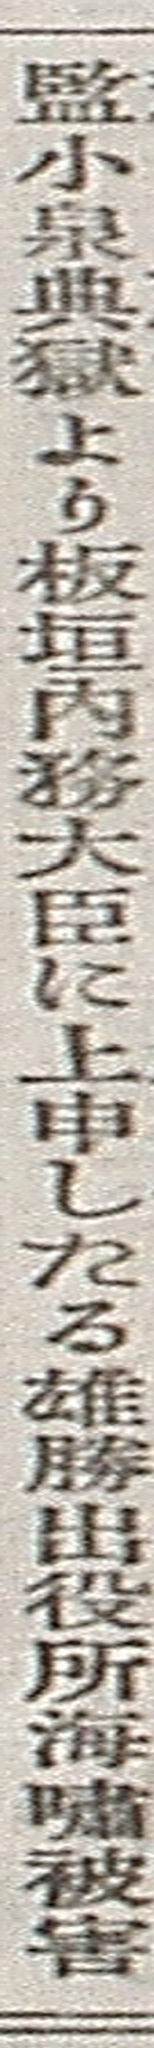監小泉典獄より板垣内務大臣に上申したる雄勝出役所海嘯被害
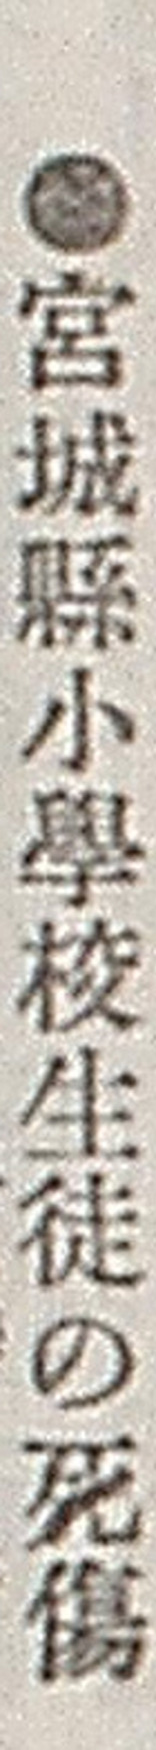●宮城県小学校生徒の死傷
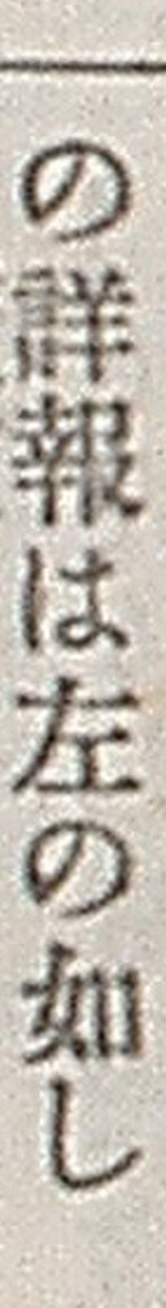の詳報は左の如し
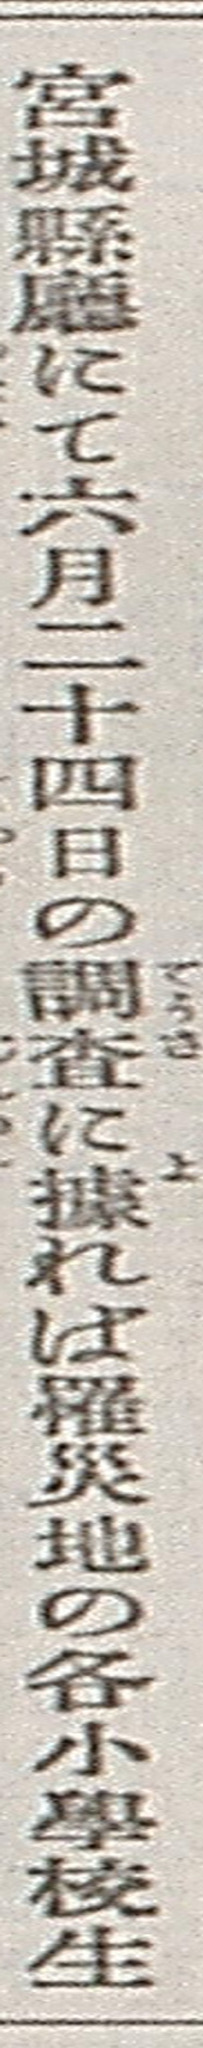宮城県庁にて六月二十四日の調査に拠れば罹災地の各小学校生
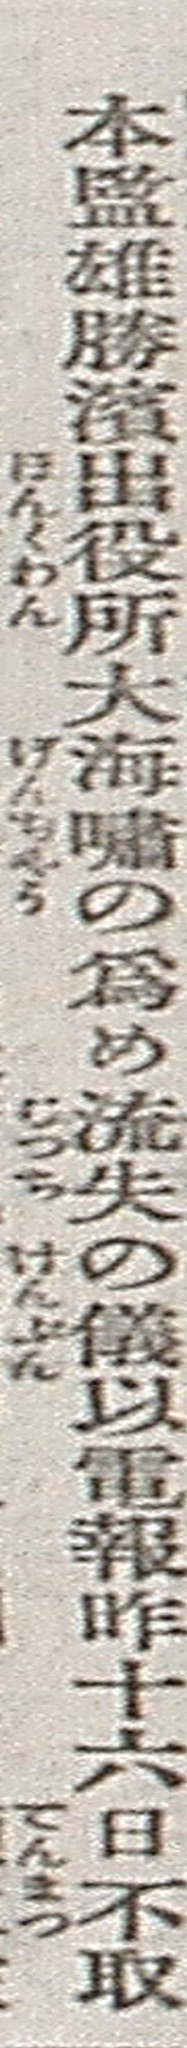本監雄勝浜出役所大海嘯の為め流失の儀以電報昨十六日不取
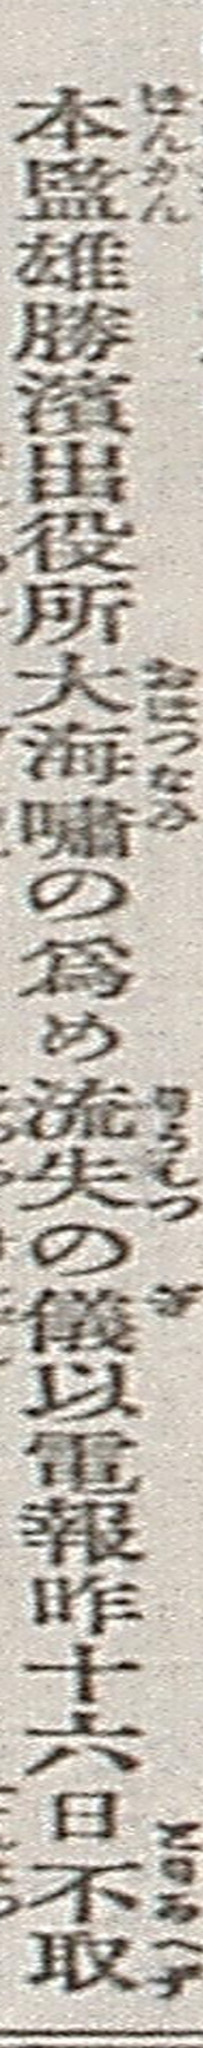本監雄勝浜出役所大海嘯の為め流失の儀以電報昨十六日不取
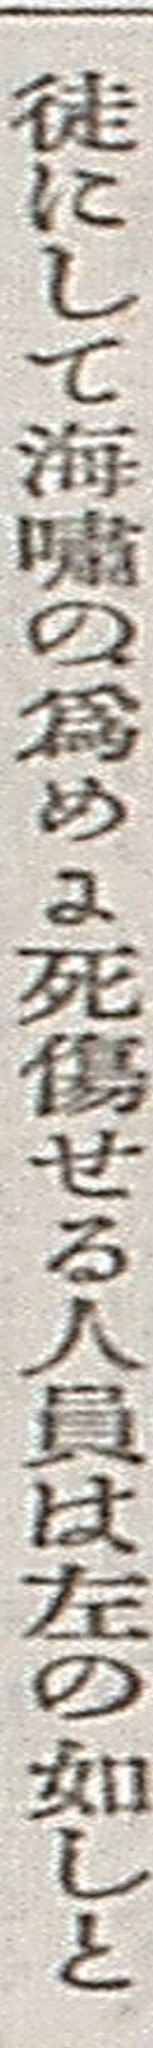徒にして海嘯の為めに死傷せる人員は左の如しと
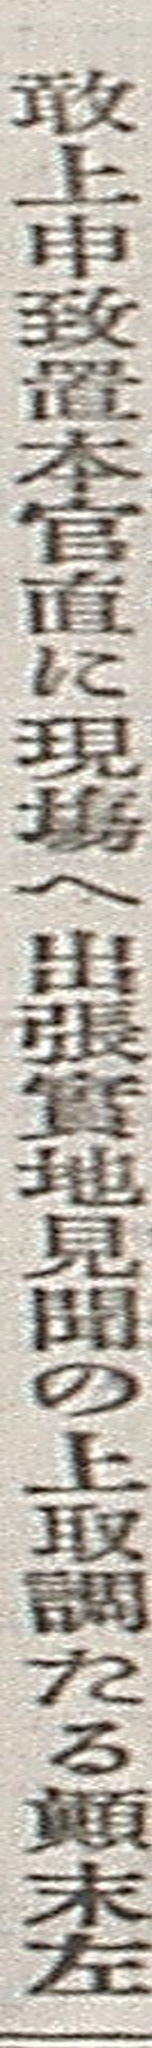敢上申致置本官直に現場へ出張実地見聞の上取調たる顛末左
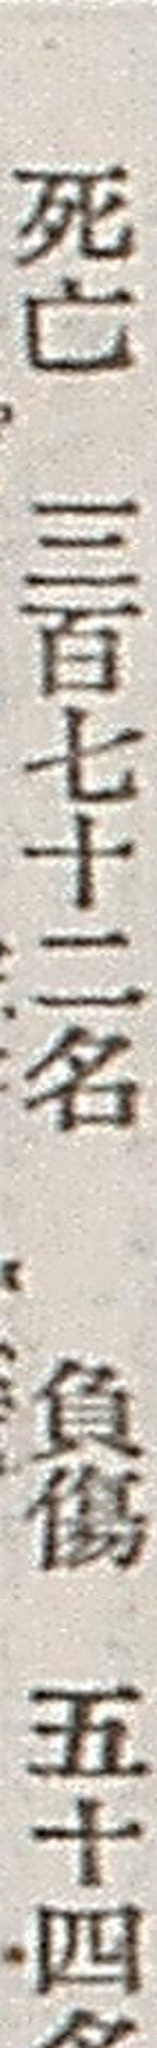死亡三百七十二名負傷五十四名
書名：風俗畫報臨時増刊第百十九號　大海嘯被害録（中）
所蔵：東京大学地震研究所図書室 Earthquake Research Institute Library, The University of Tokyo, JAPAN
